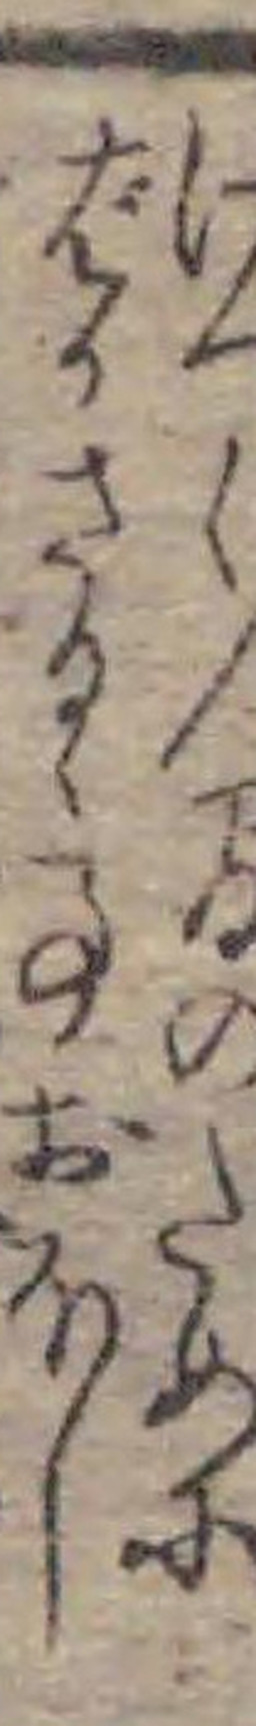ばかさるゝ事おほく
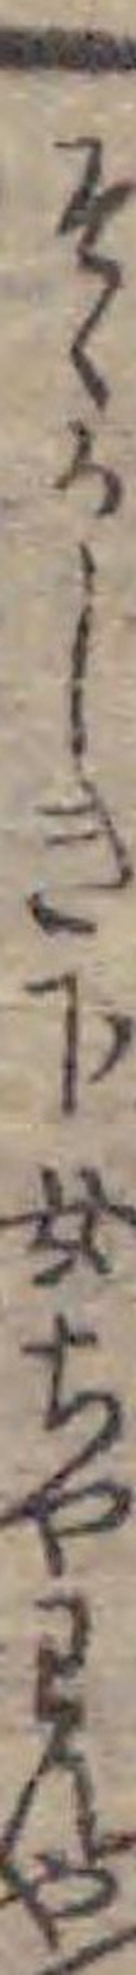そゝかしき下女ちやわんや
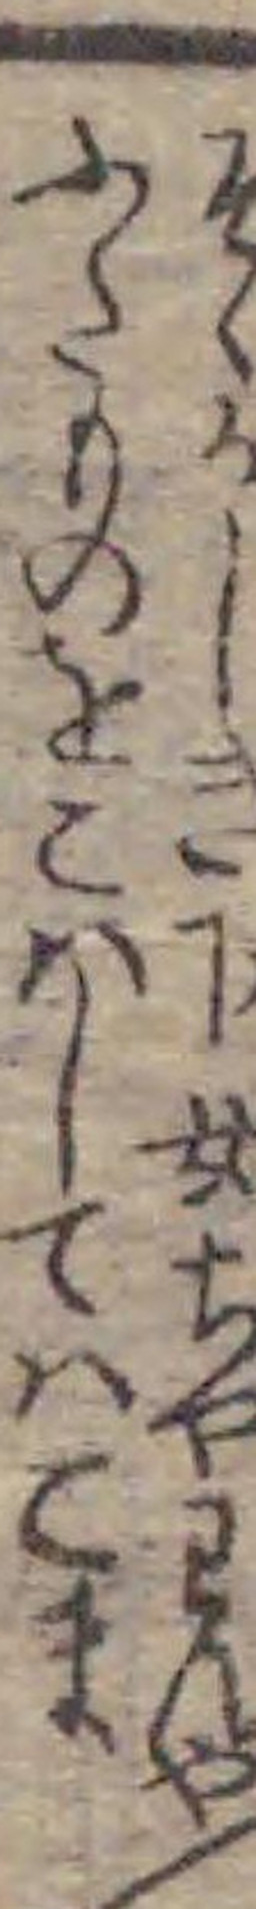ふたものをこはしてはこま
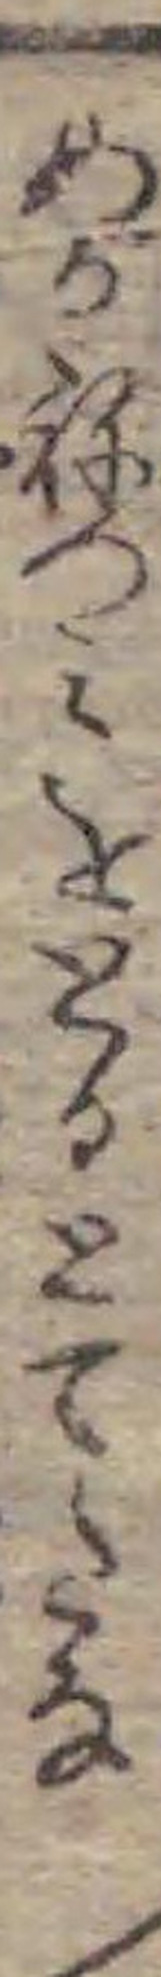めがねつみをとるとてたな
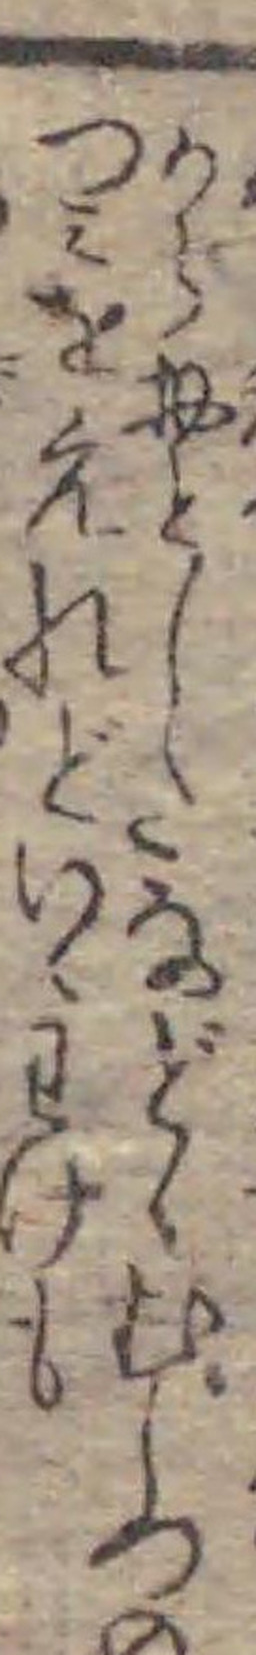つみをえれどいゝわけも
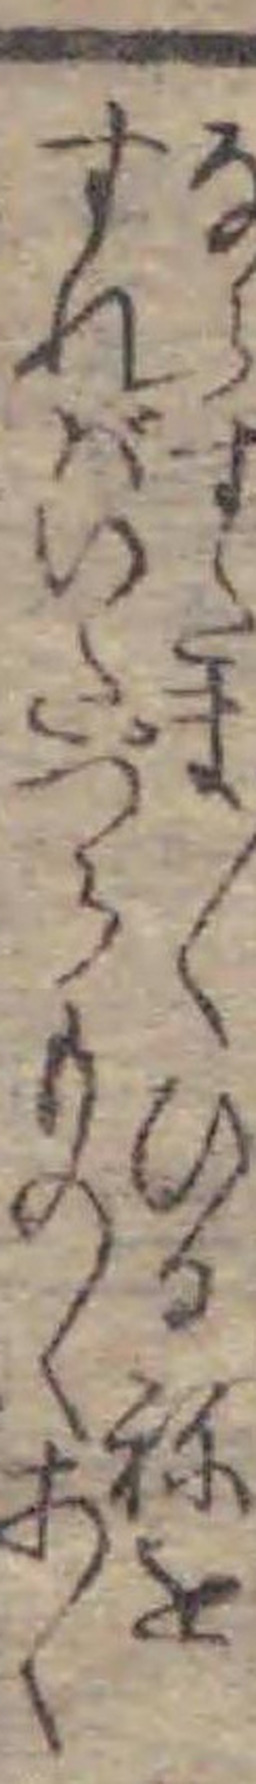すればいたづらものヽあく
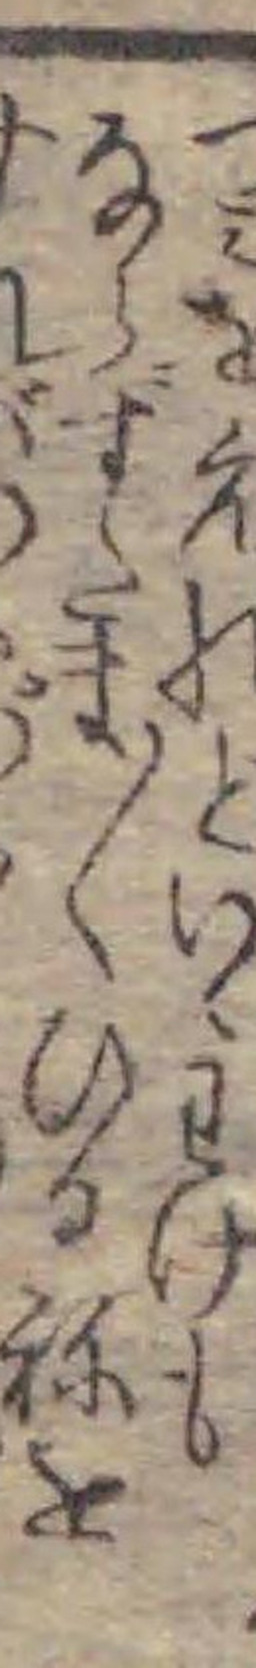ならずたま〳〵ひるねを
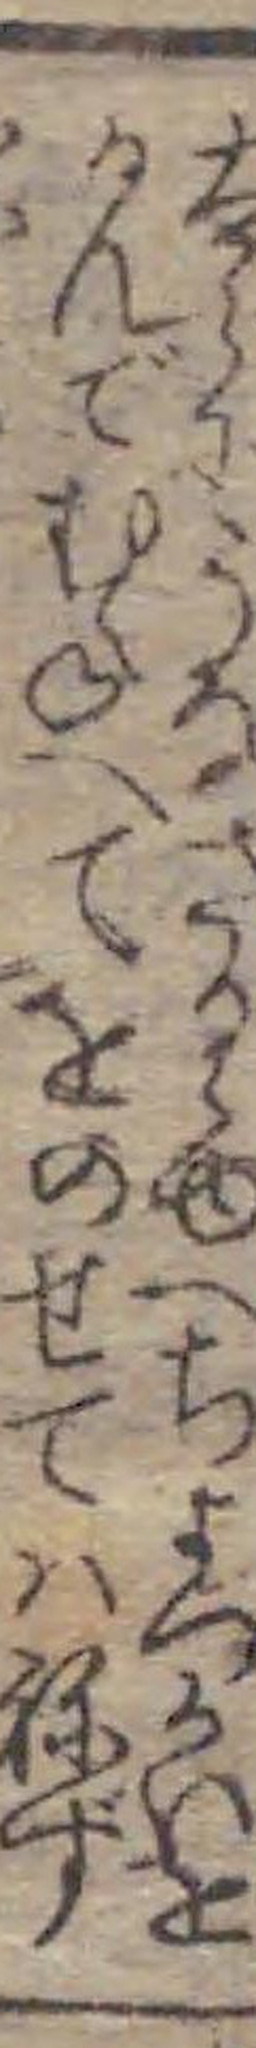かんでむねへてをのせてはねず
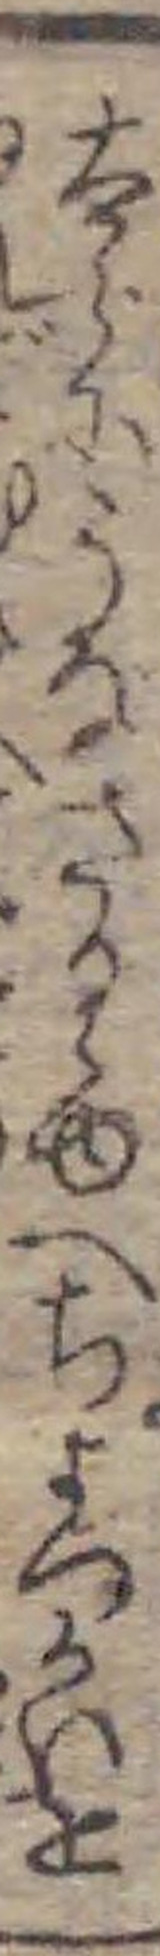太郎にうなさるゆへちよつかいを
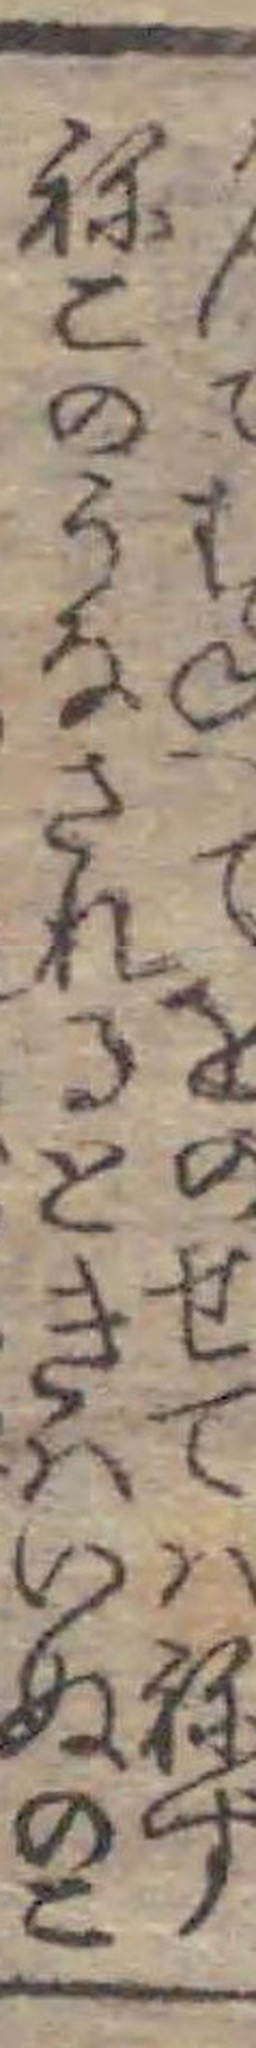ねこのうなされるときはいぬのこ
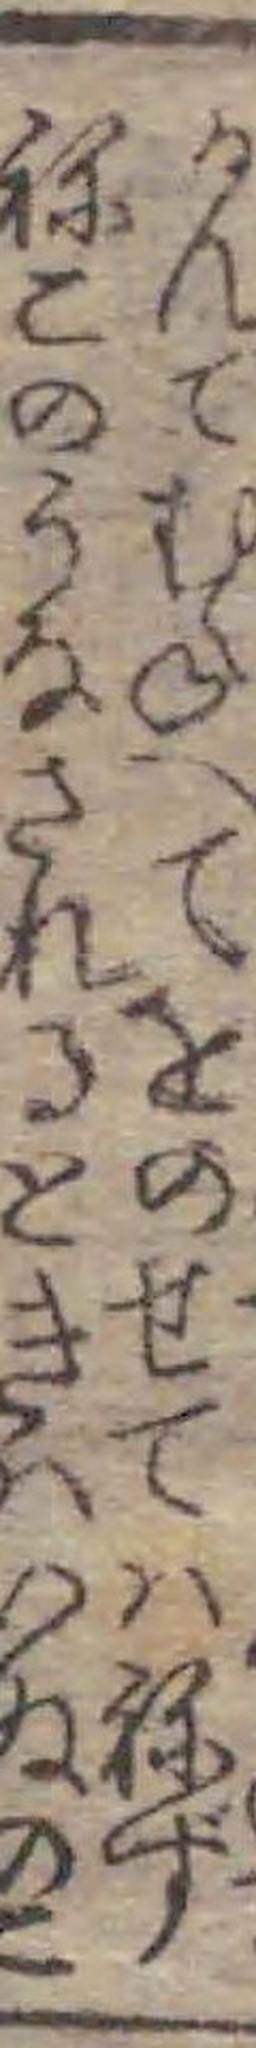ねこのうなされるときはいぬのこ
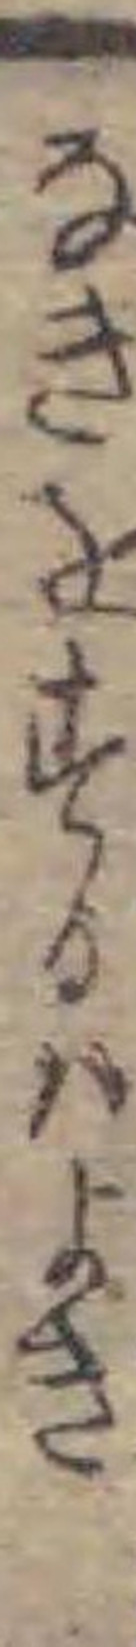なきをするはよき
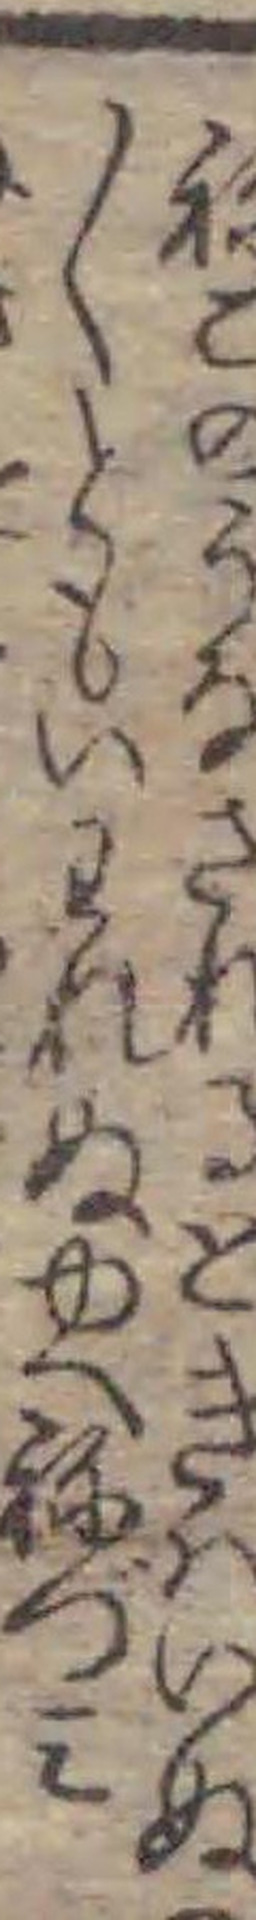くともいわれぬゆへねづみ
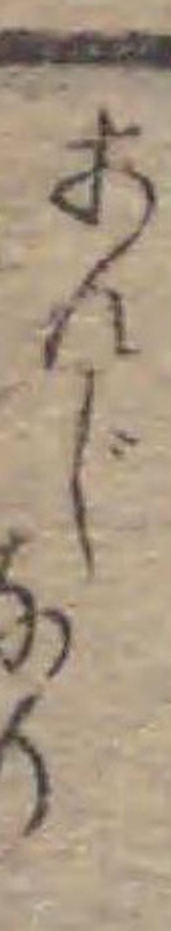あんじなり
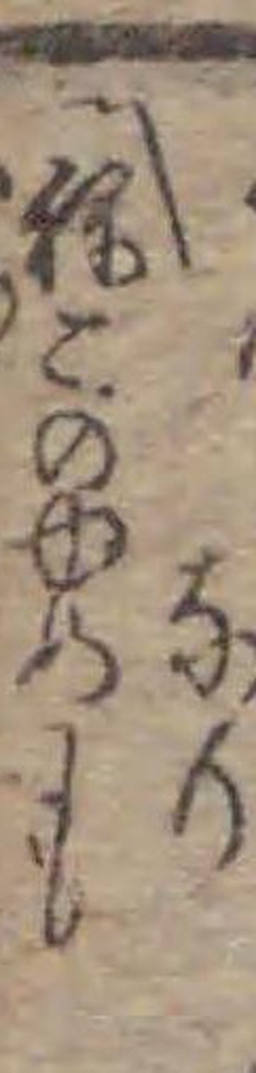〽ねこのゆめにも
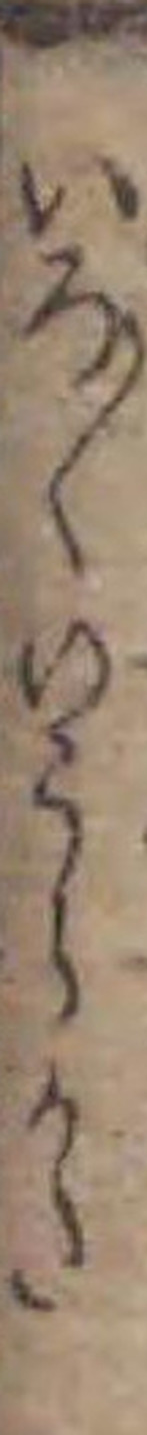いろ〳〵のうらかた
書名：怪物つれつれ草 : 2巻
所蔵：国立国会図書館 National Diet Library, JAPAN
